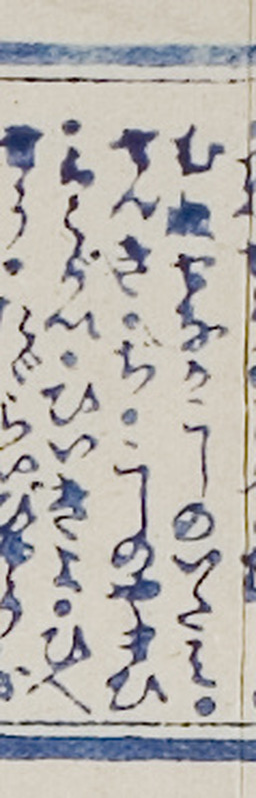せんき・ぢ・こしのやまひ
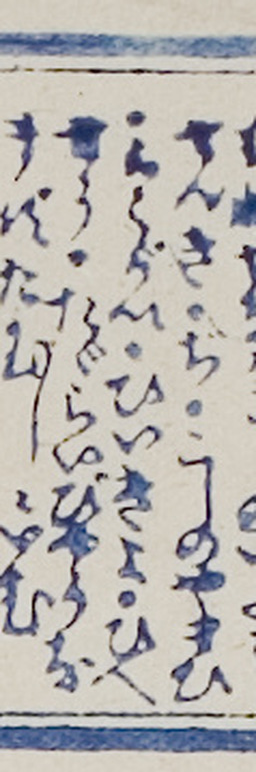・らうがい・ひいきよ・ひへ
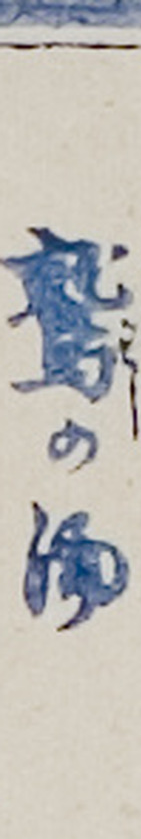鷲の湯
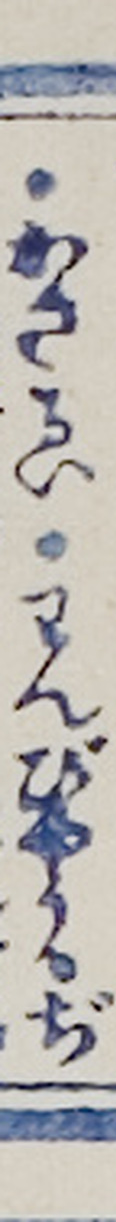・かさるい・わんびやう・ぢ
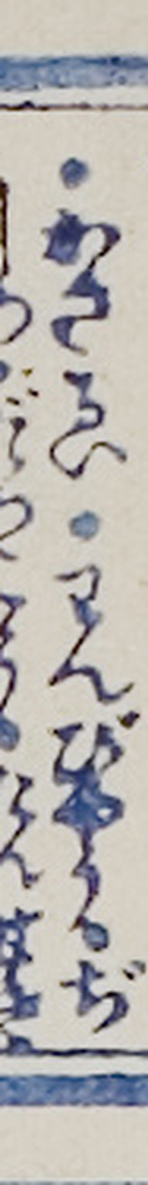・かさるい・わんびやう・ぢ
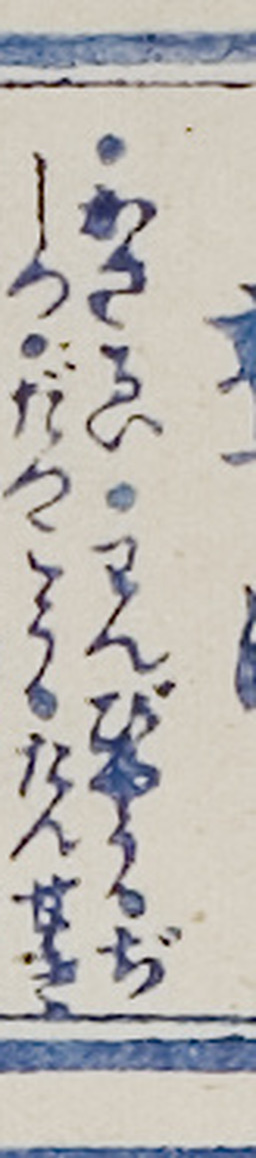しつ・だつこう・たんせき
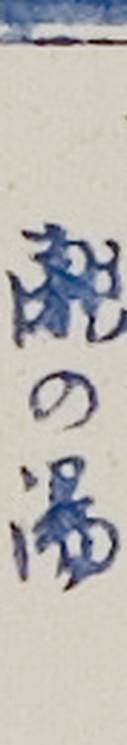瀧の湯
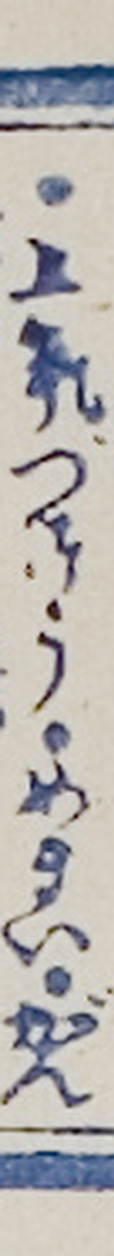・上気づう・めまい・がん
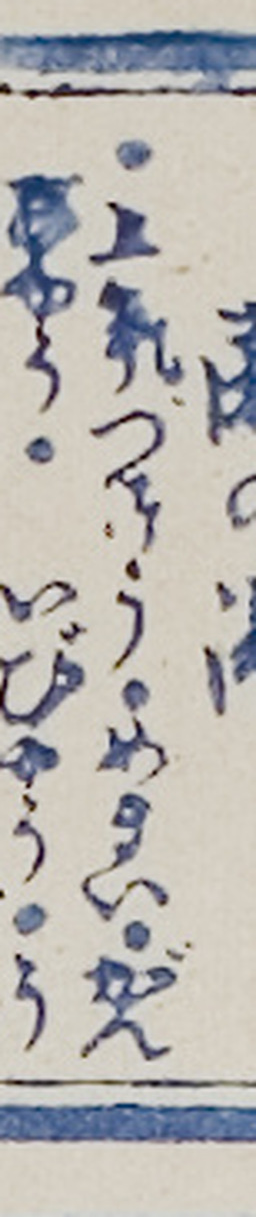びやう・いびやう・う
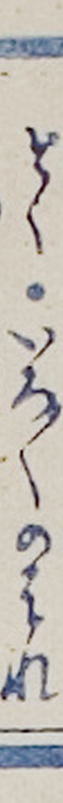どく・いろ〳〵のはれ
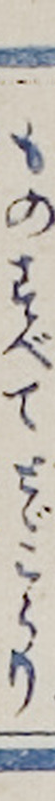ものすべてとゞこうり
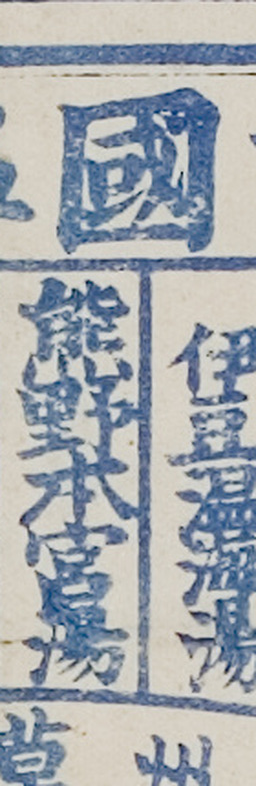熊野本宮湯
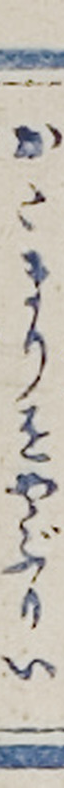かたまりをやぶりい
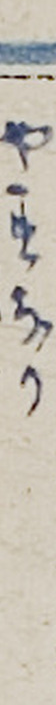やすなり
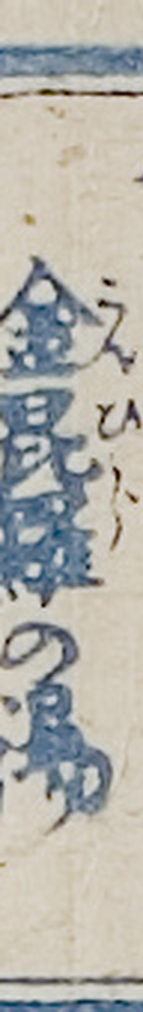金毘羅の湯
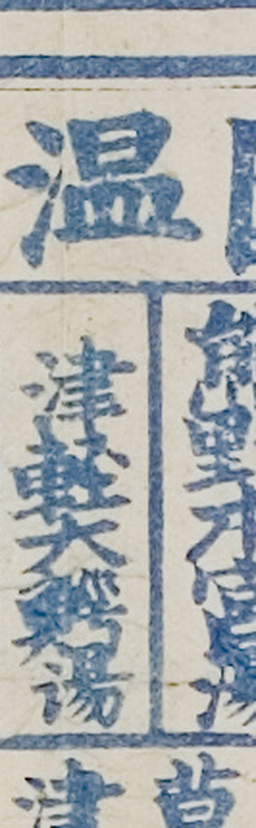津軽大鰐湯
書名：諸国温泉鑑 上州草津温泉図
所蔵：東京大学総合図書館 General Library in the University of Tokyo, JAPAN
